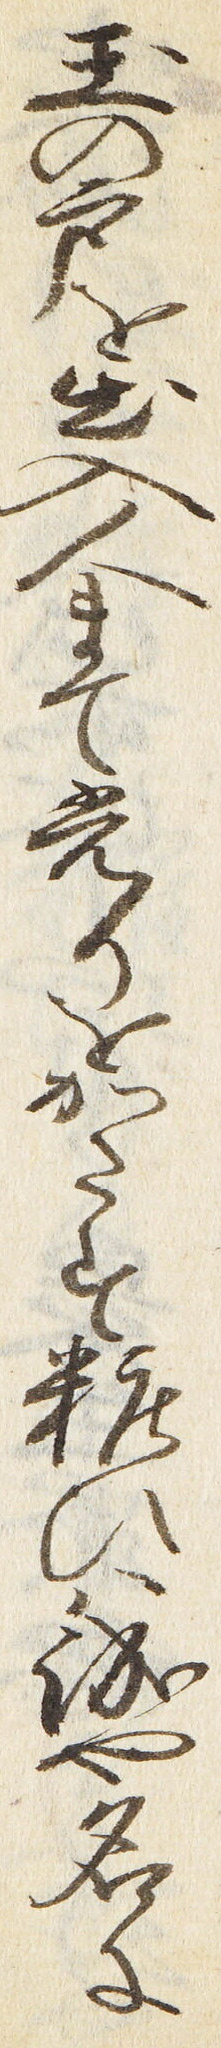玉の戸を出入人まて光りをかさす粧ひは誠や名に
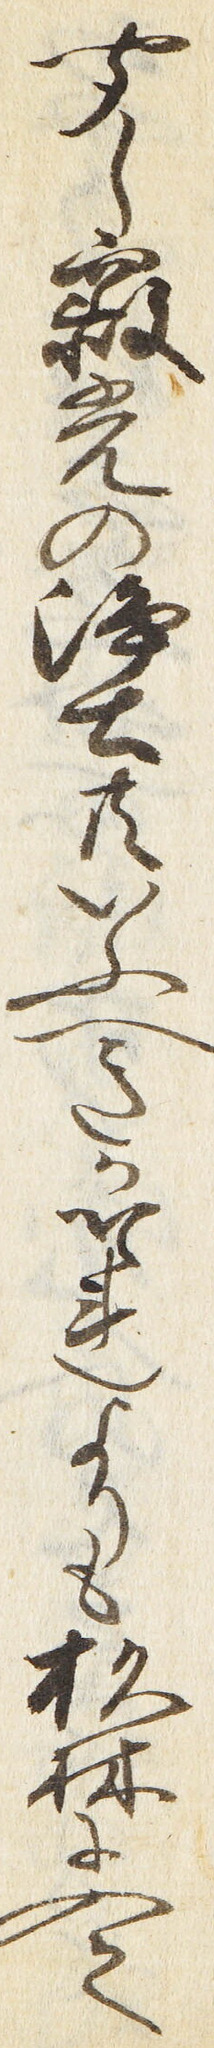聞し寂光の浄土共いふへきかそれよりも杉林に入て
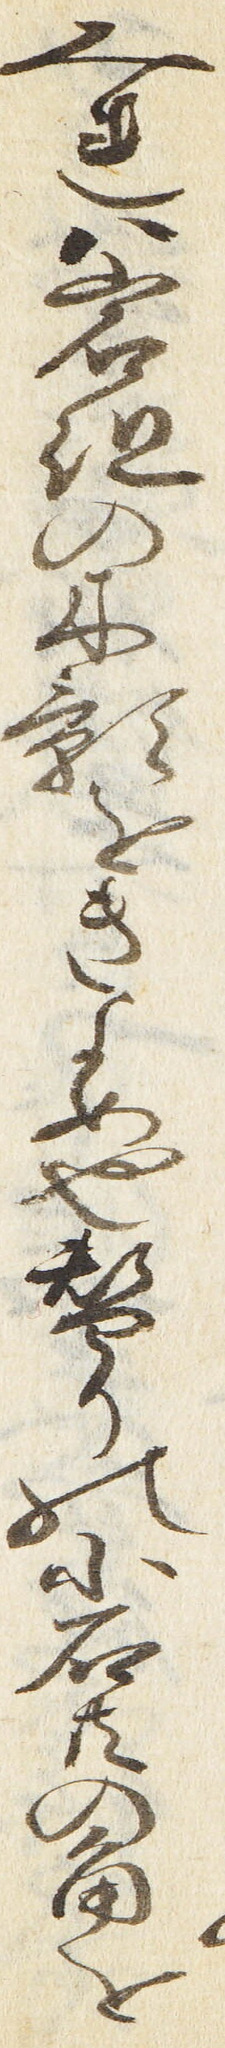みれは岩組の木影をきよめや替りの小石共の角を
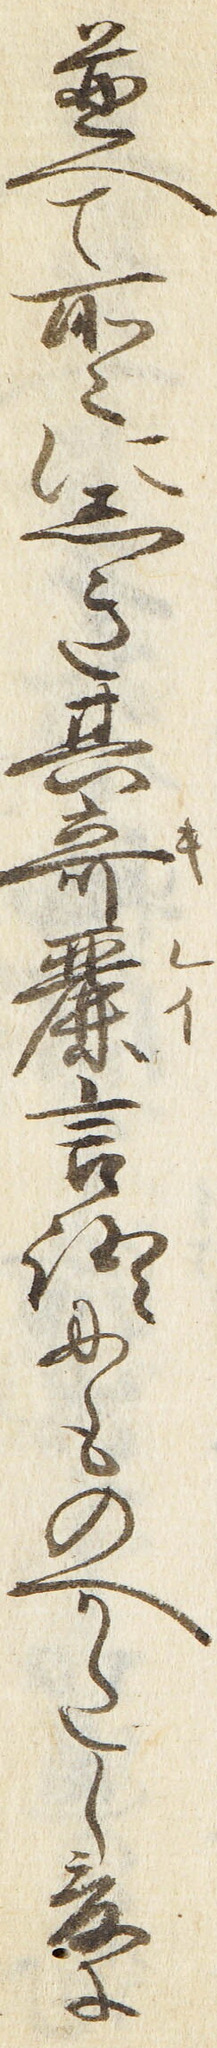並へて所々にしき其奇麗言語にものへかたし爰に
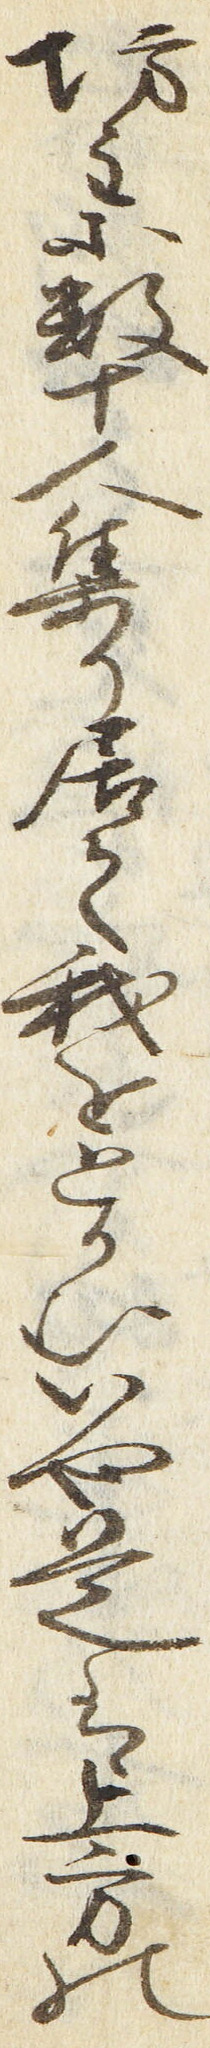坊主等数十人集り居て我をとかむいや是は上方の

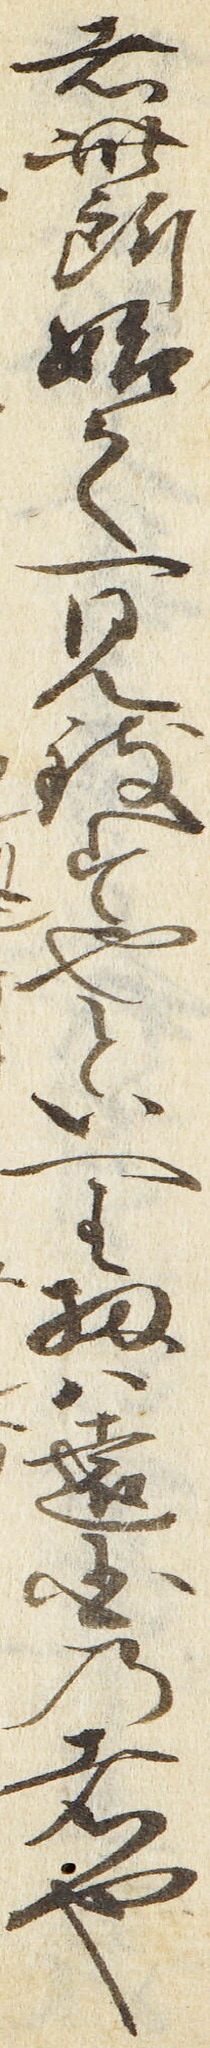者此所始て一見致す也といへは扨は遠国の者也
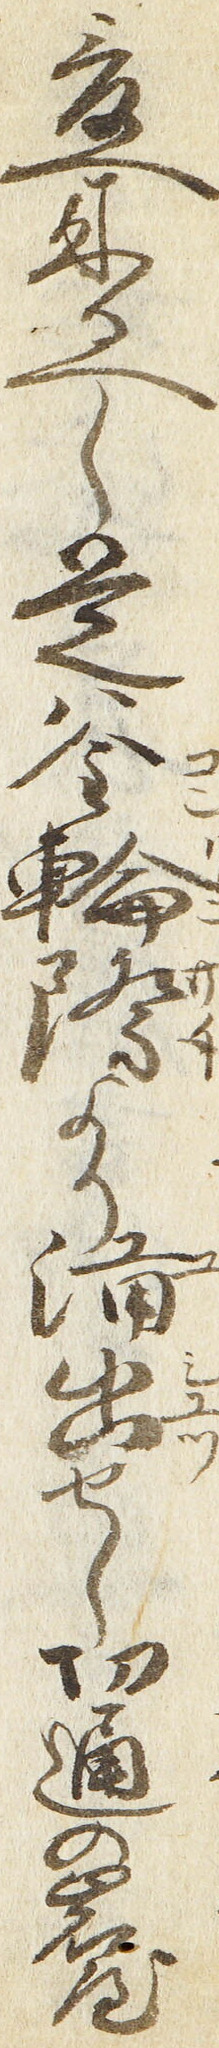爰へ来るへし是ハ金輪際より之涌出せし切通の岩屋
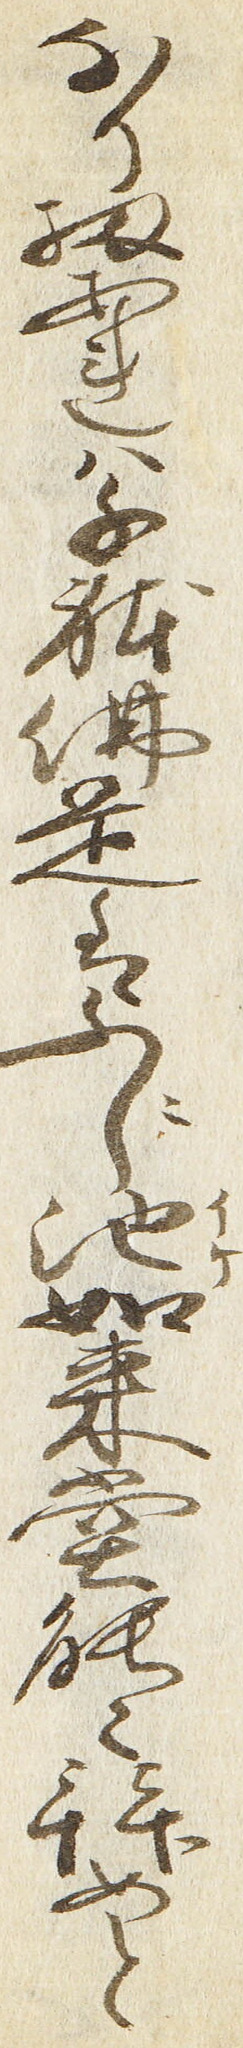なり扨あれは千体仏是はふじ池如来堂能々拝めと
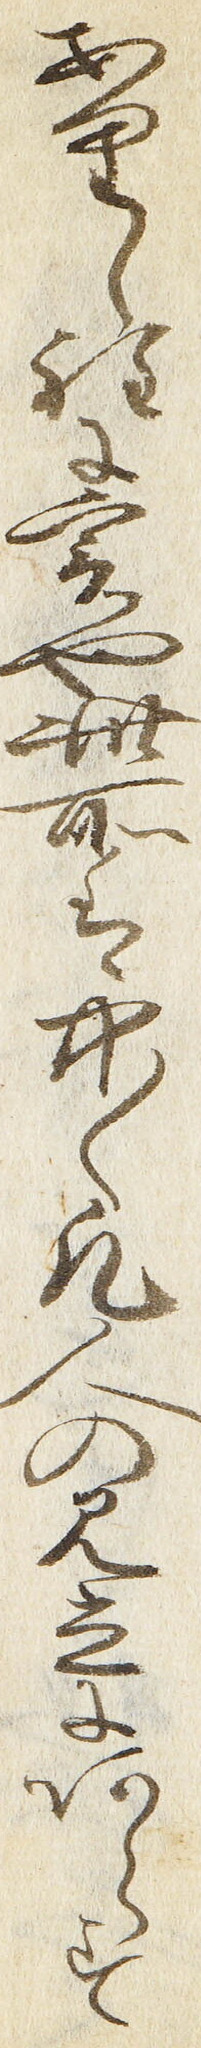ありし程に実や此所は中〳〵凡人の見立にあらす
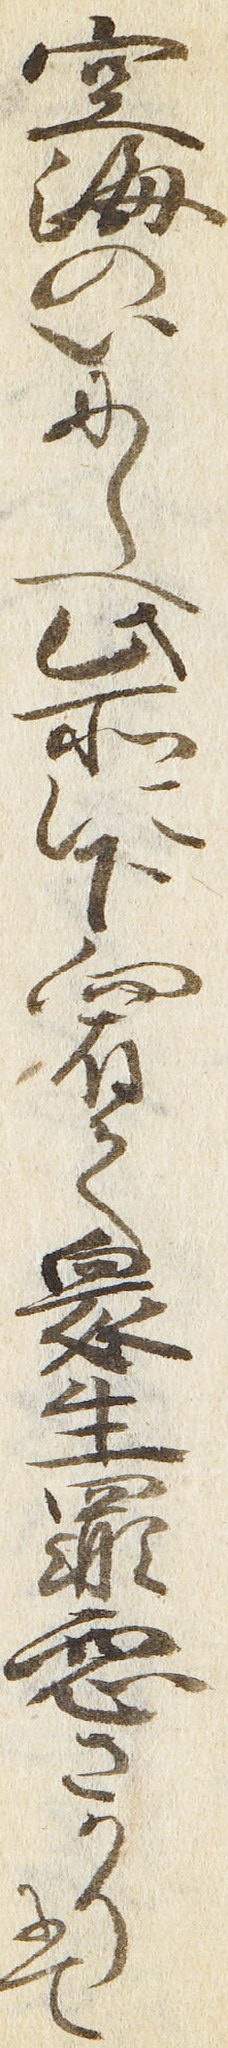空海のいにしへ此所に下向有之衆生罪悪さかりにて
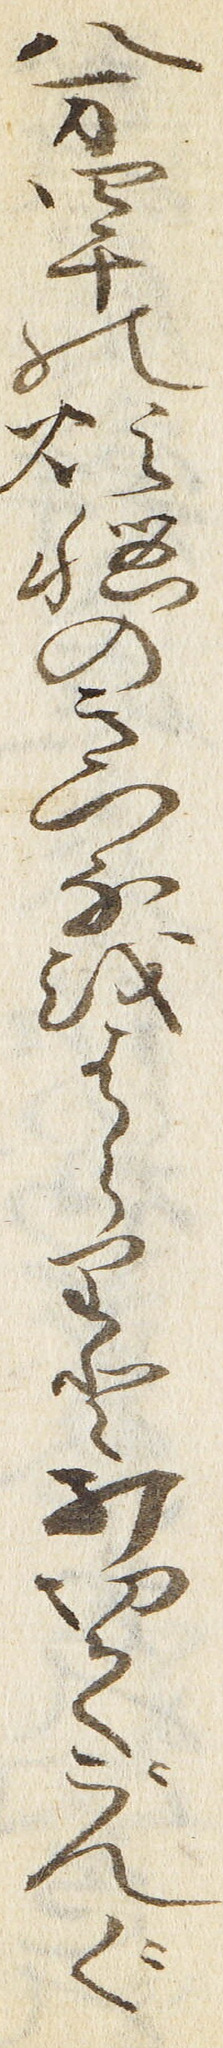八万四千の煩悩のきつなをよりし里と打切てごんぐ
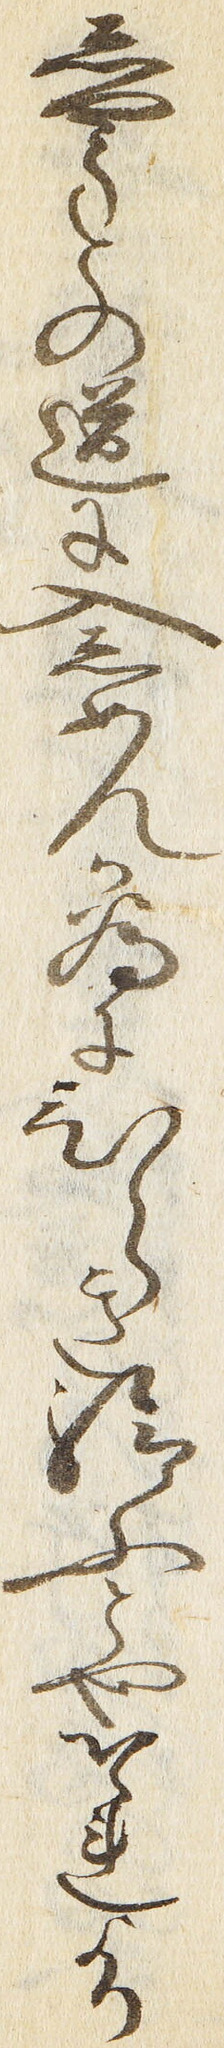しやうとの道に入しめんか為にひらき給ふとやそれより
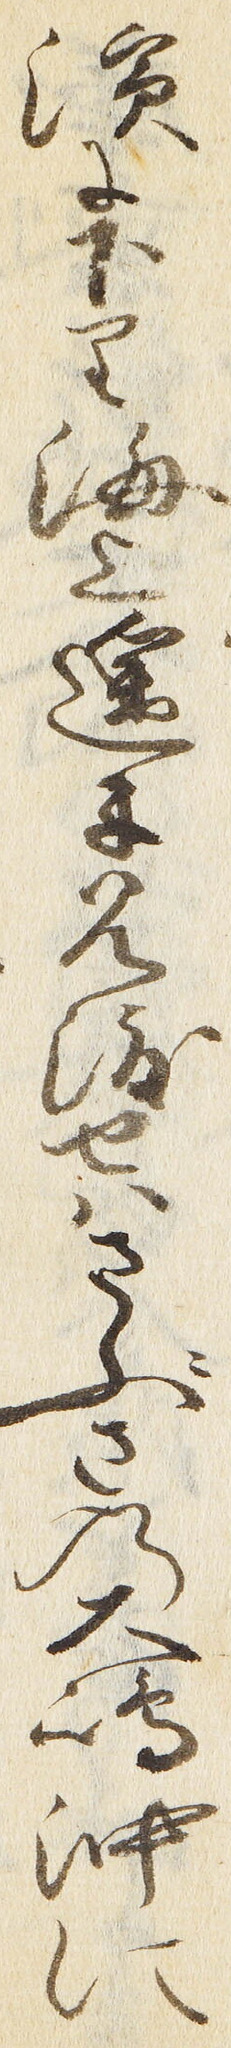浜に下り海上遥に見渡せはさぶさの大嶋沖に
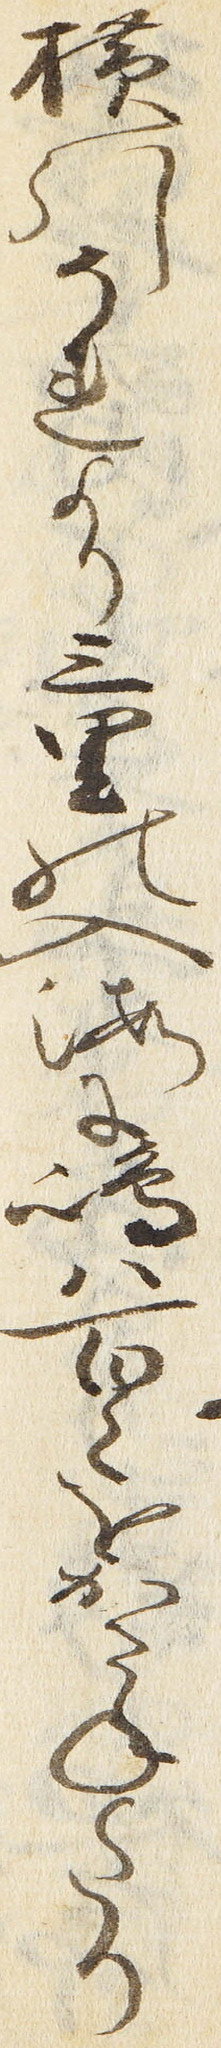横引それより三里の入海に嶋は百々をかさねたり
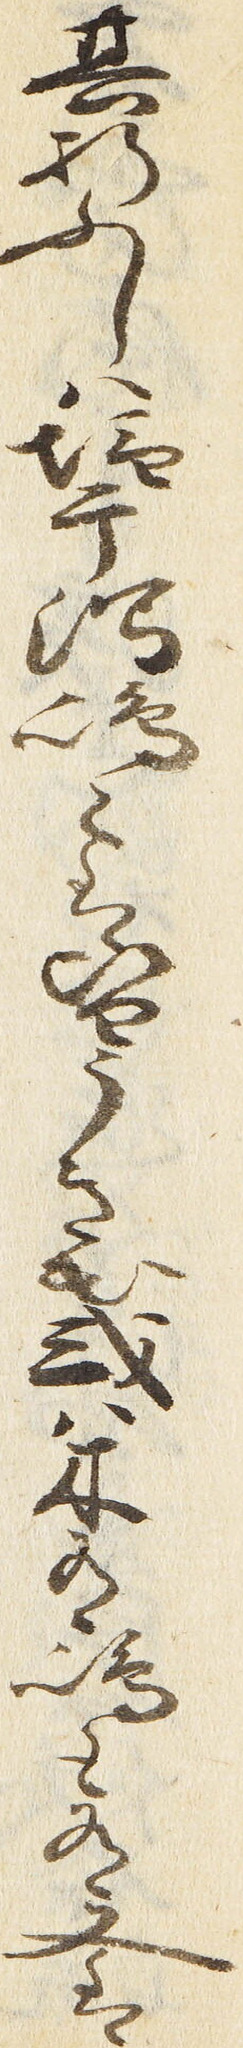其折ふしは塩干潟嶋々は皆うき出或は木有嶋も有又は
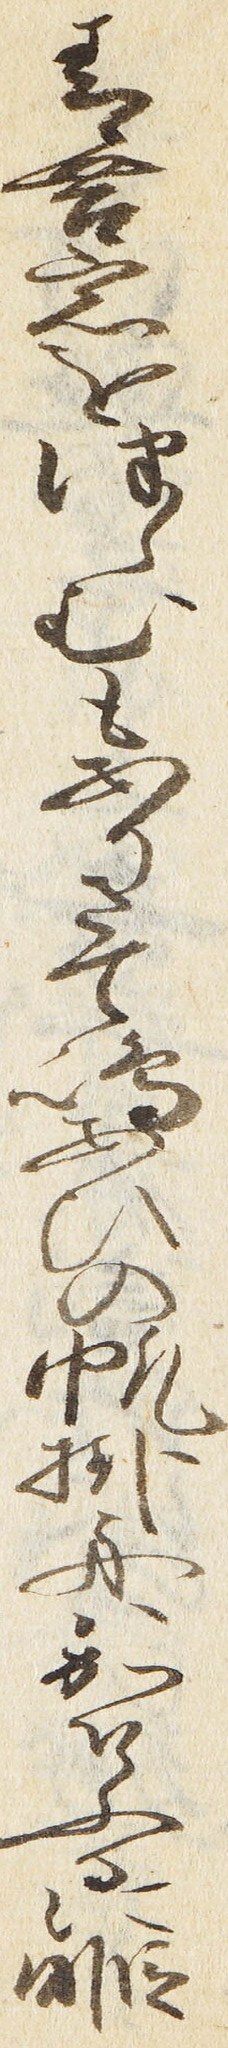青苔岩をつかむもありさて嶋あひの帆掛舟はかそふるに暇
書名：海陸世話日記
